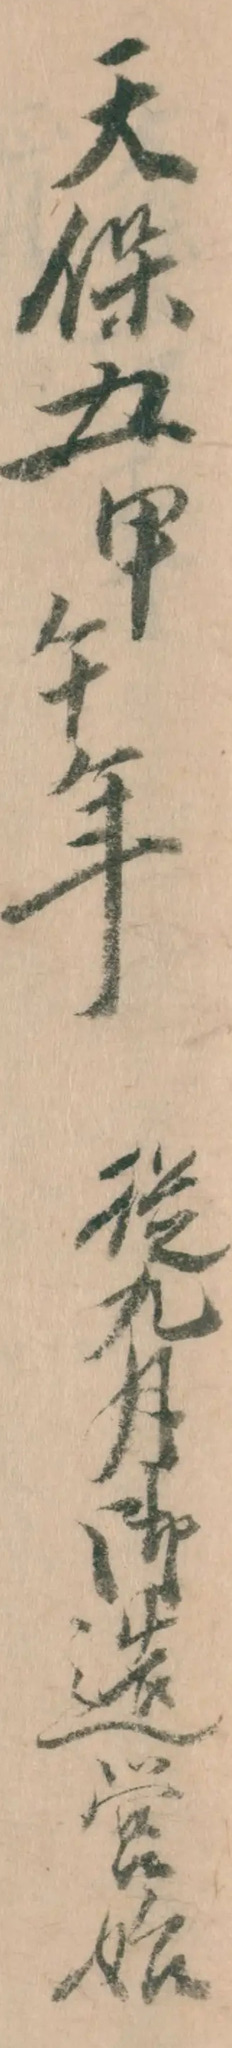天保五甲午年従九月御造営始
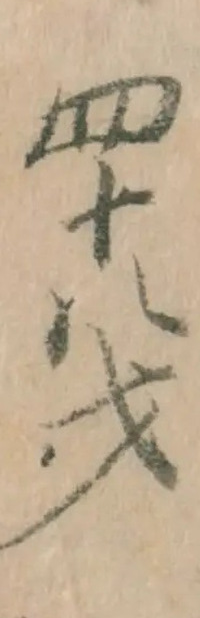四十八才

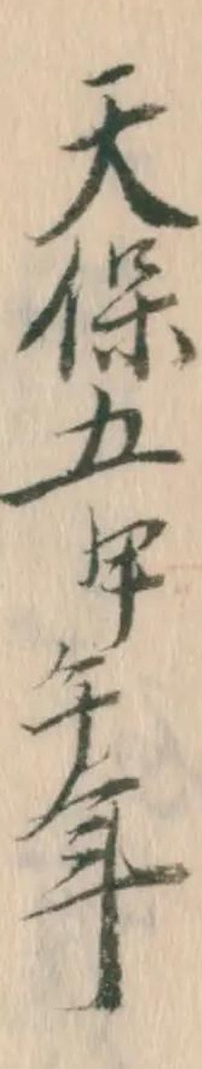天保五甲午年
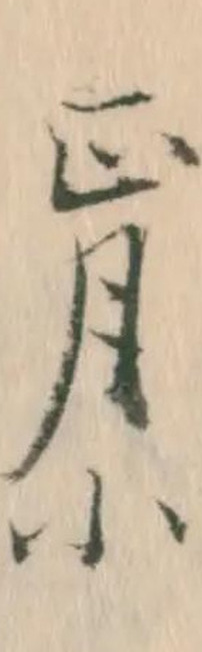正月小
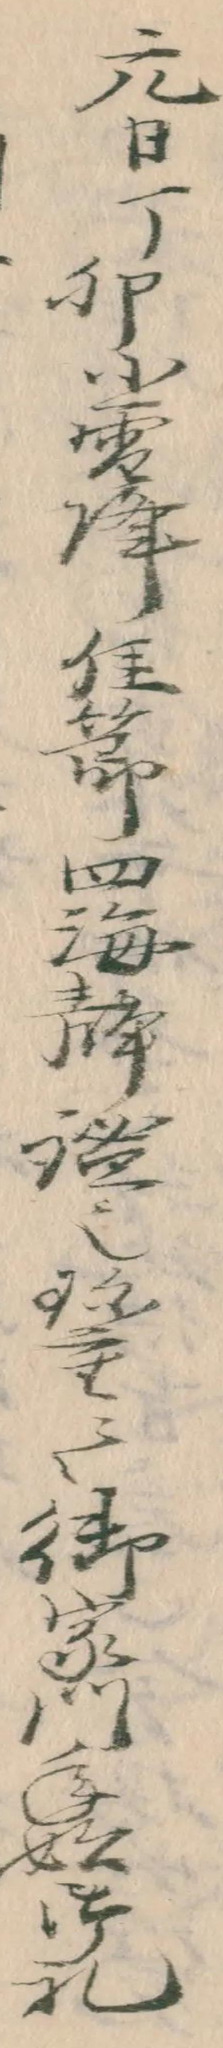元日丁卯小雪降佳節四海静謐也珍重々々御家門年始御礼
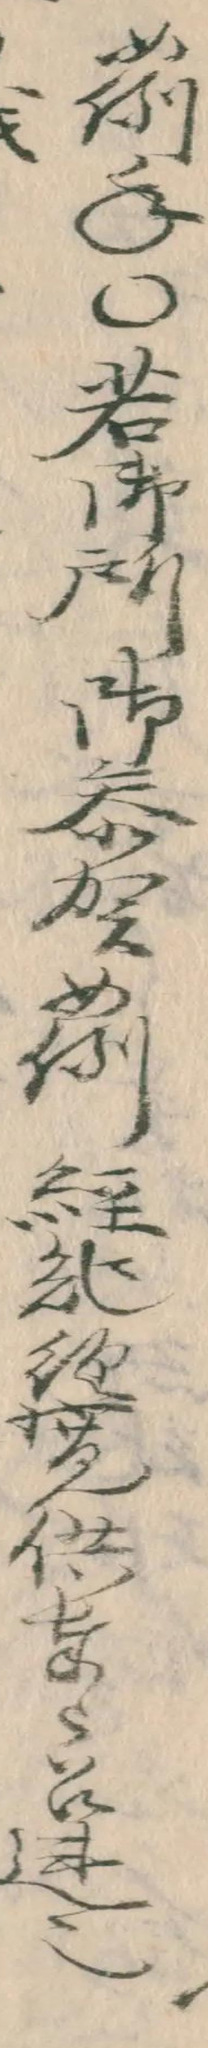如例年○若御所御参賀如例経紀経寛供奉被召連也
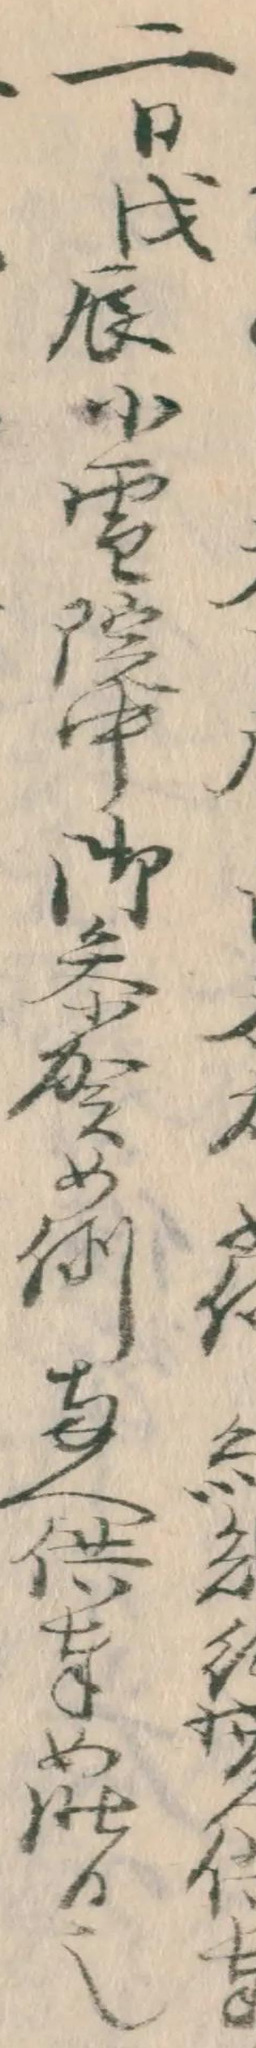二日戊辰小雪院中御参賀如例両人供奉如昨日也
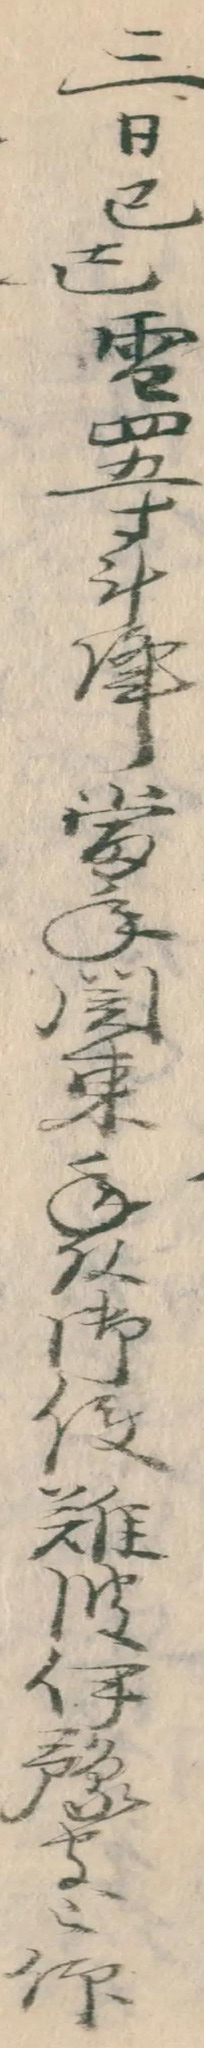三日己巳雪四五寸斗降當年関東年頭御使難波伊豫守被仰
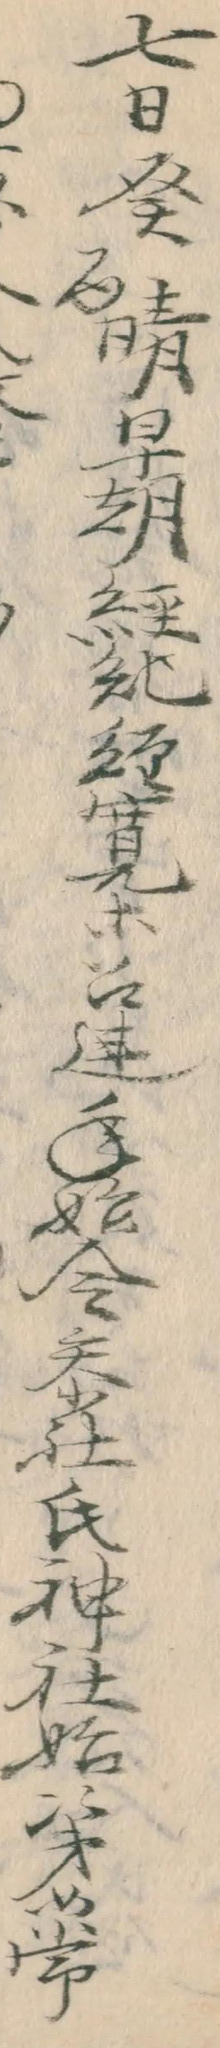七日癸酉晴早朝経紀経寛等召建年始令参社氏神社始次第如常
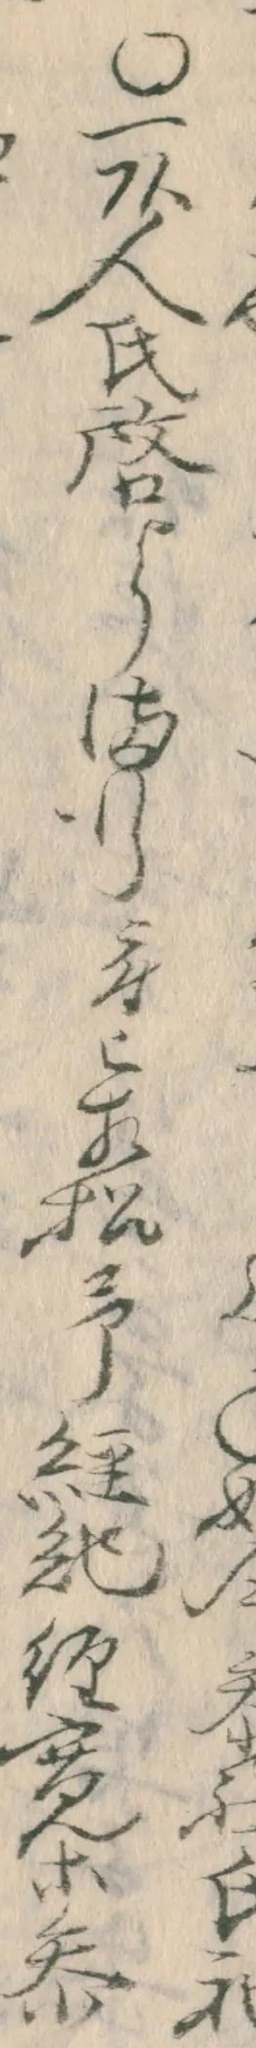○一頭人氏啓より満行ニ付被相招予経紀経寛等参
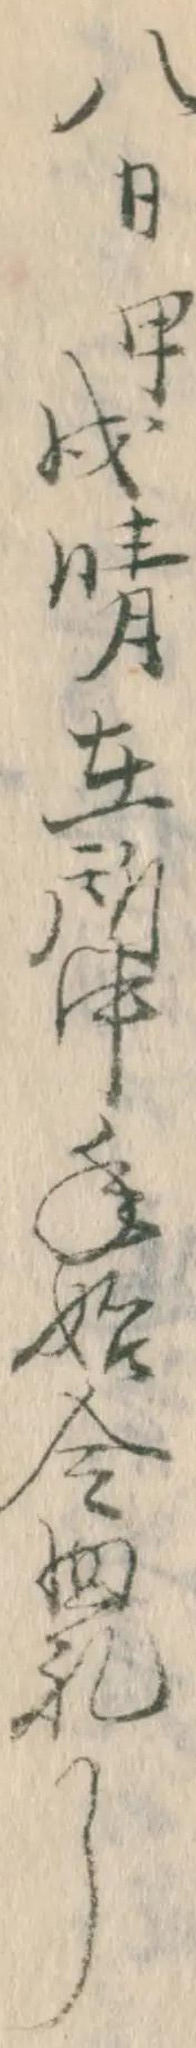八日甲戌晴在所中年始令回礼了
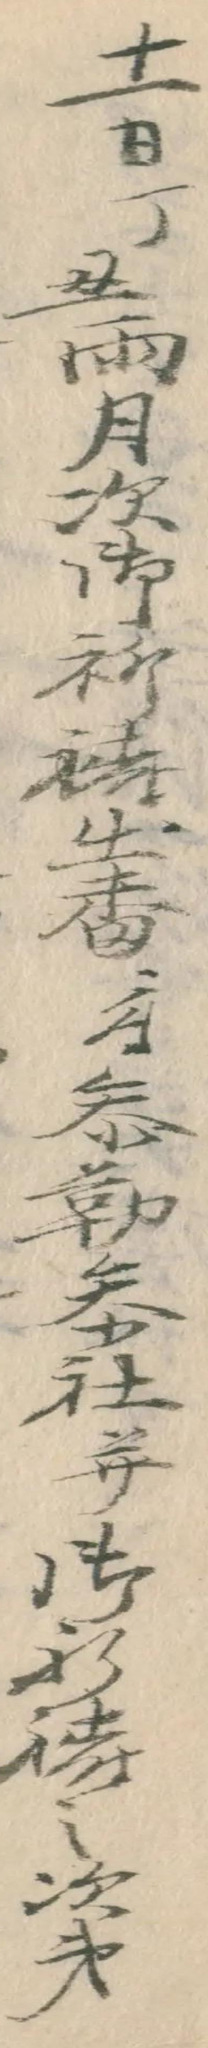十一日丁丑雨月次御祈祷出番ニ付参勤参社幷御祈禱之次第
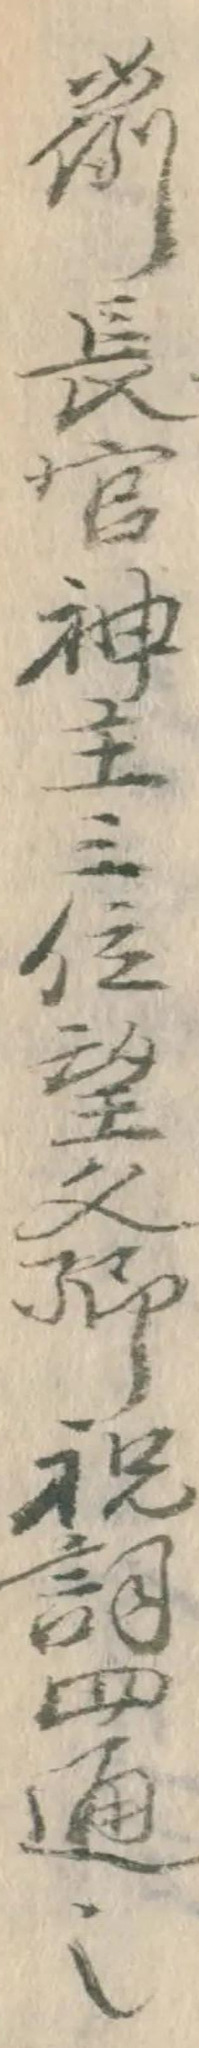如例長官神主三位望久卿祝詞四通也

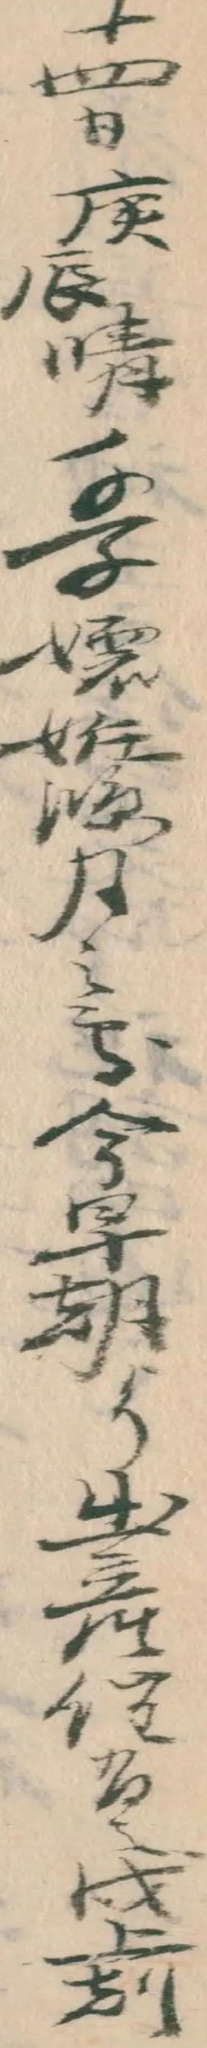十四日庚辰晴千子懐妊臨月之處今早朝より出産催有之戌上刻
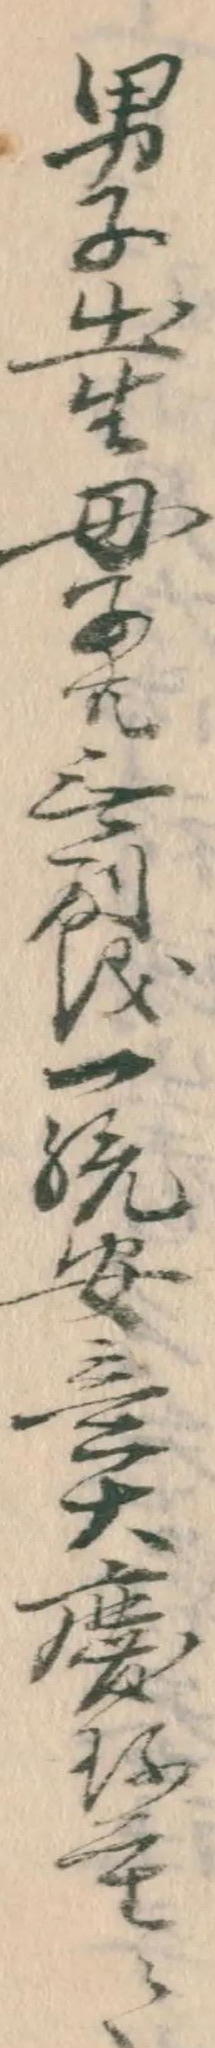男子出生母子共無別儀一統安意大慶珍重々々
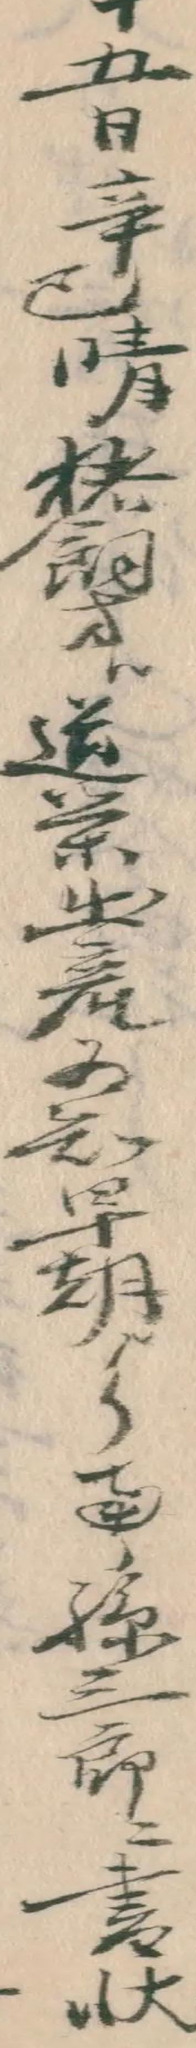十五日辛巳晴猪飼方え道栄出産為知早朝より南ノ孫三郎ニ書状
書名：賀茂社記録. 第66冊
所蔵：国立国会図書館 National Diet Library, JAPAN
